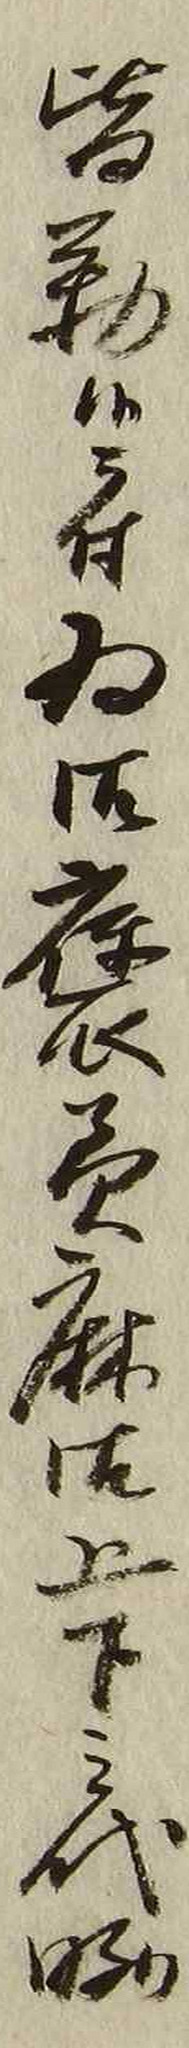皆勤候ニ付為御褒美麻御上下之代晒
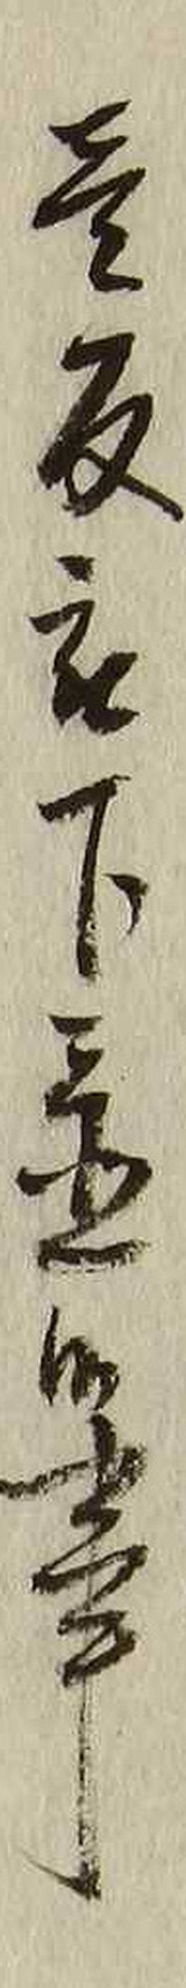壱反被下置候事
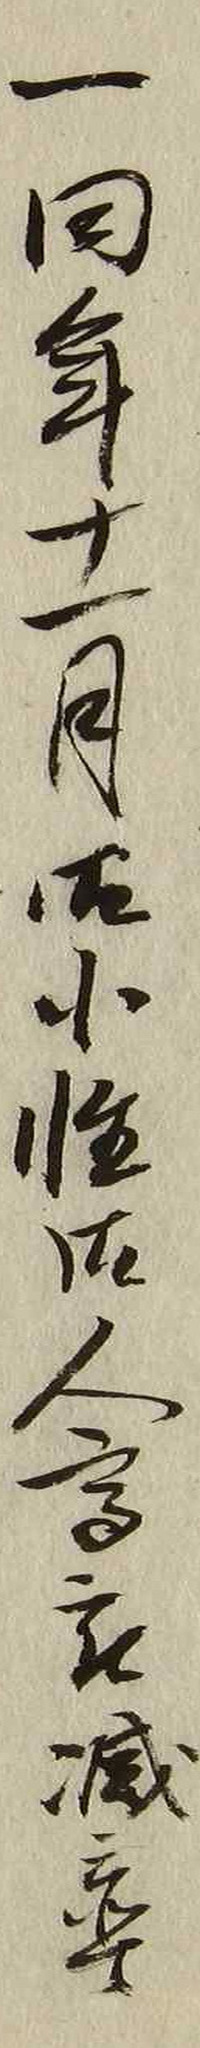一同年十一月御小性御人高被減置候
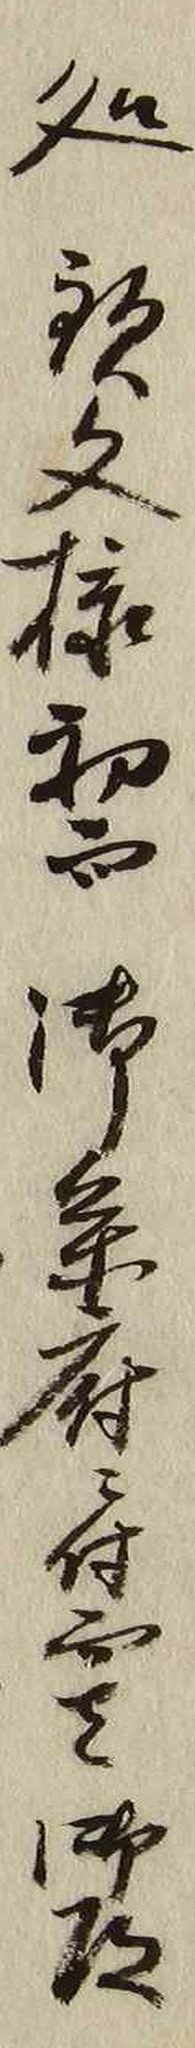処欽文様初而御参府ニ付而者御道
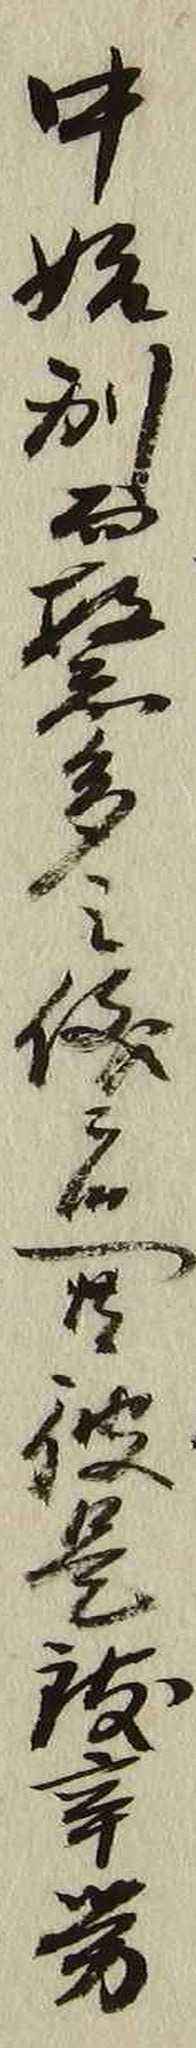中始別而繁多之儀ニ候へ共彼是致辛労
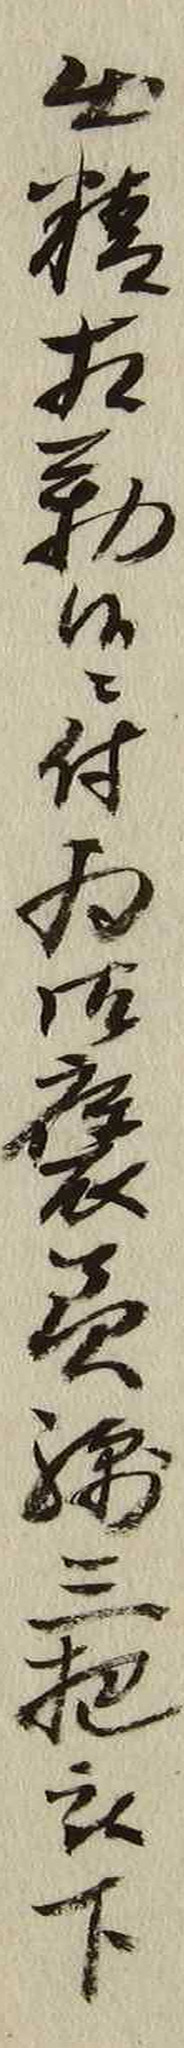出精相勤候ニ付為御褒美綿三把被下
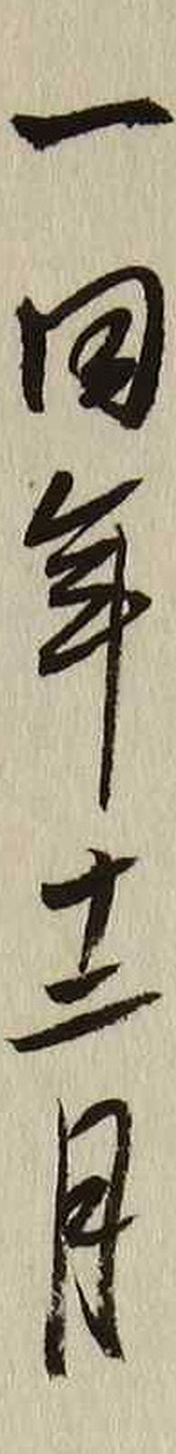一同年十二月
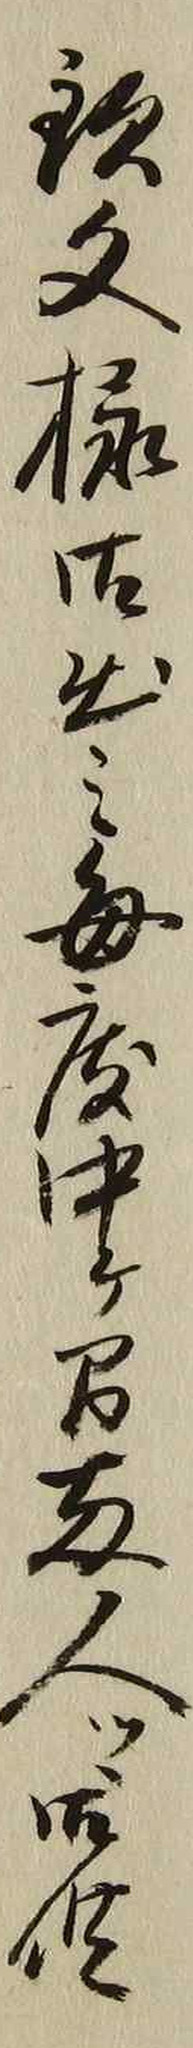欽文様御出之毎度中ケ間両人ツヽ御供
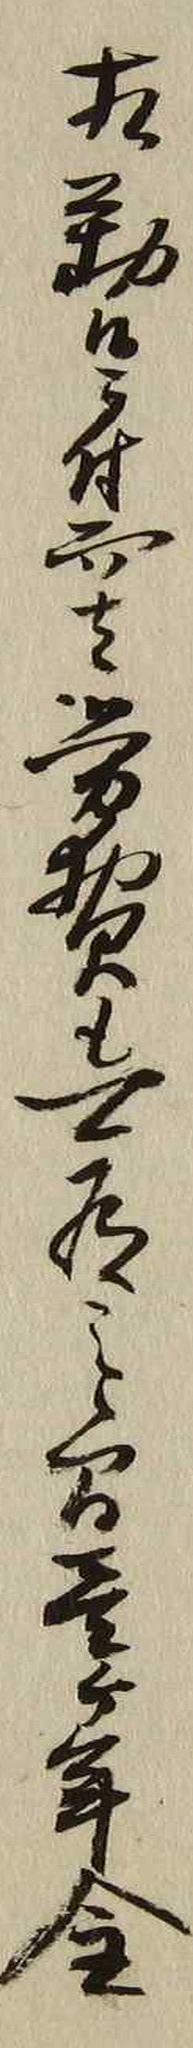相勤候ニ付而者労費も可有之候間壱ケ年金
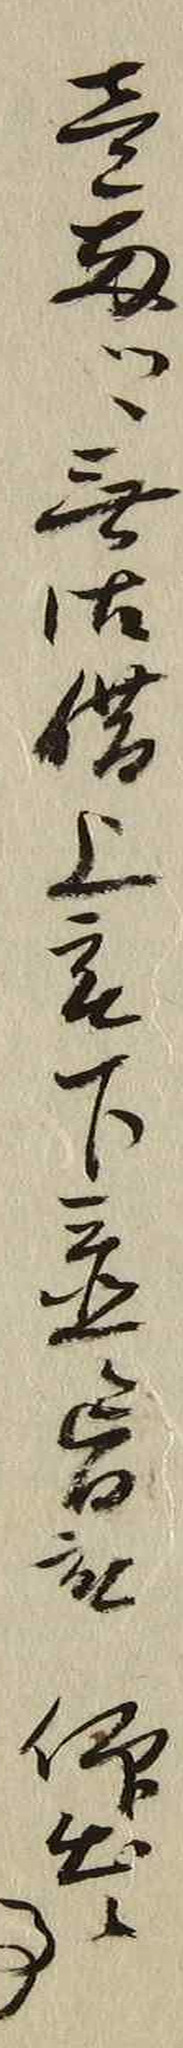壱両ツヽ無御借上被下置候旨被仰出候事
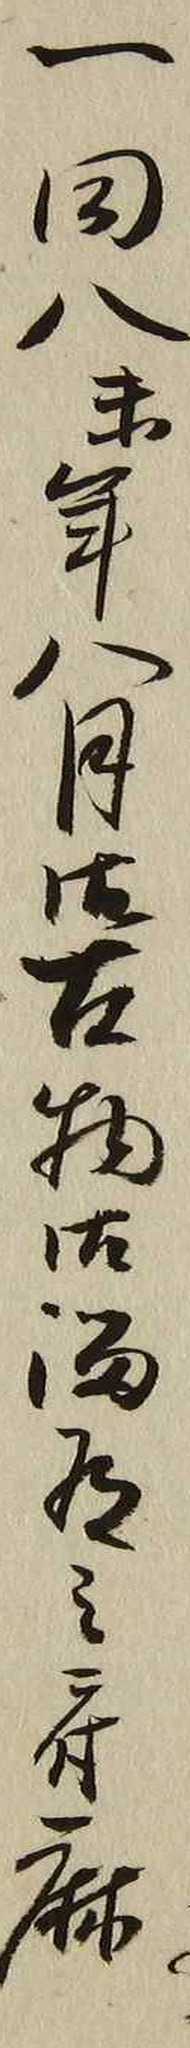一同八未年八月御古物御溜有之ニ付麻
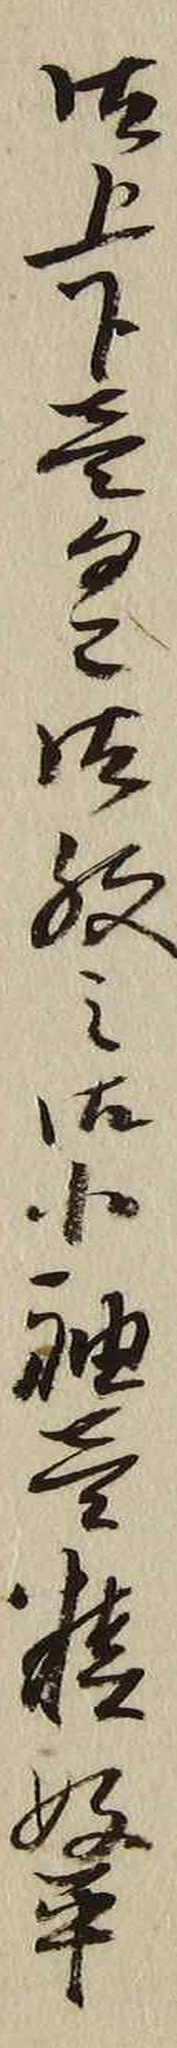御上下壱御紋之御小袖壱精好平
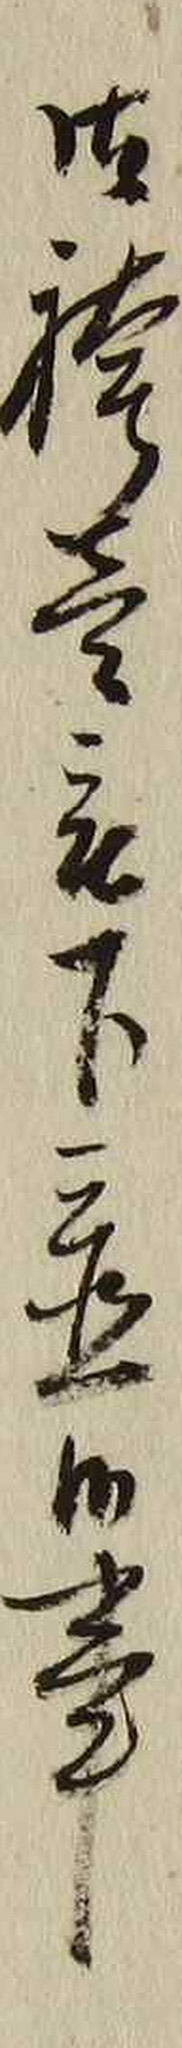御袴壱被下置候事
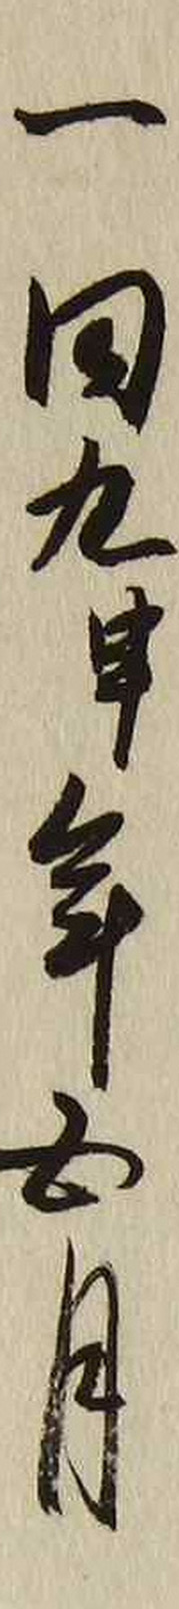一同九申年五月
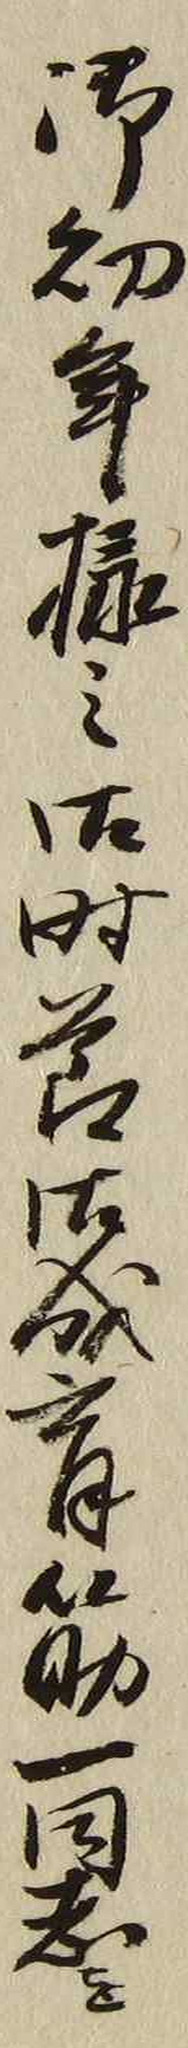御幼年様之御時節御成育筋一同志を
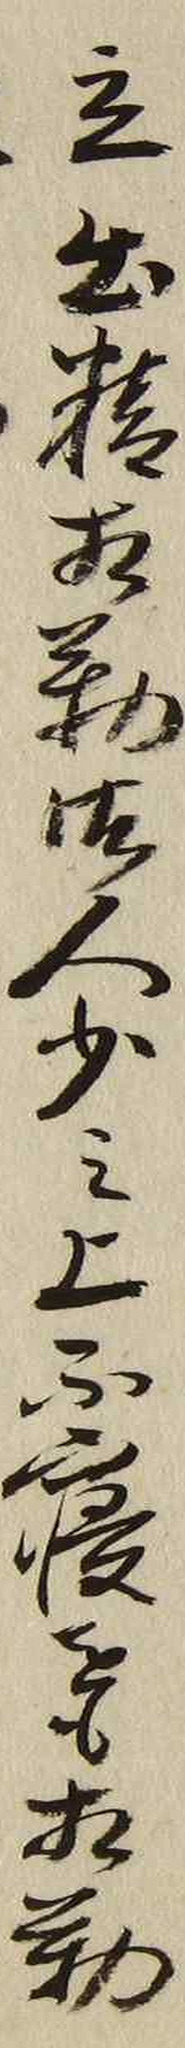立出精相勤御人少之上不寝をも相勤
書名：諸士系譜　巻之356　す之部6
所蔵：会津若松市立会津図書館
